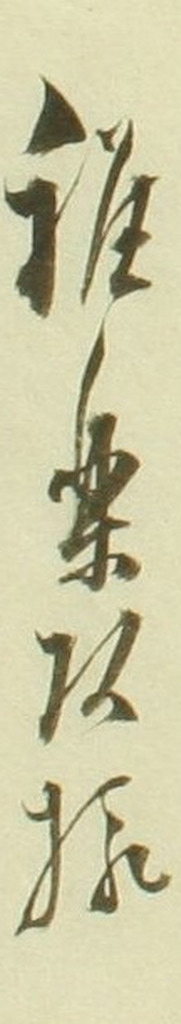雅楽頭様
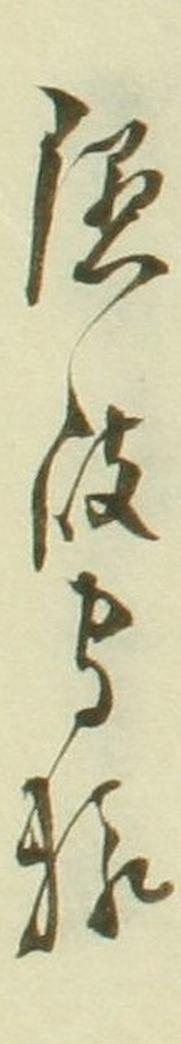隠岐守様
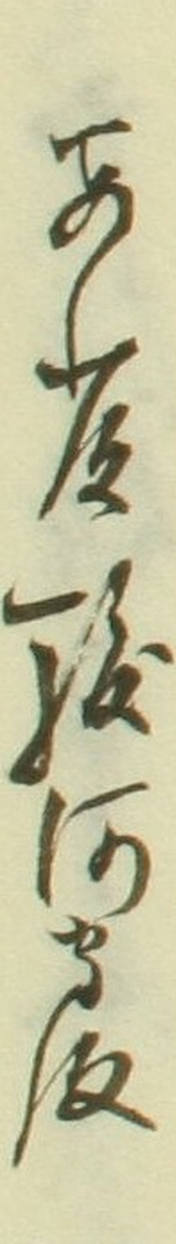安藤駿河守殿
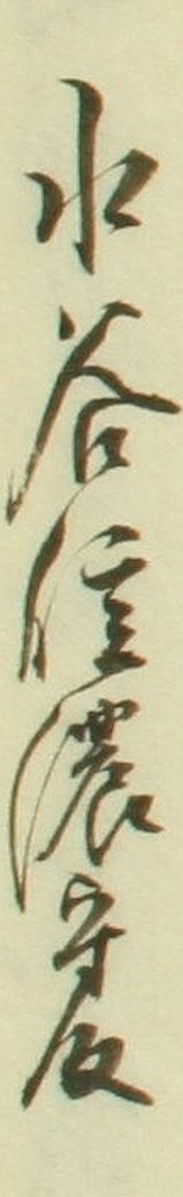水谷信濃守殿

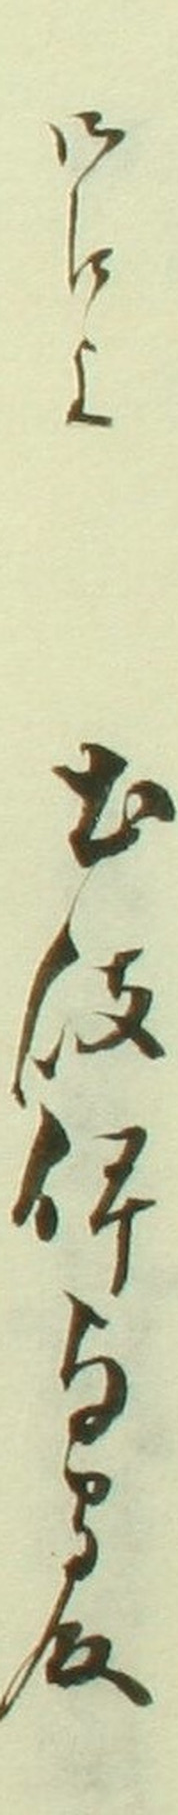御口上土岐伊与守殿
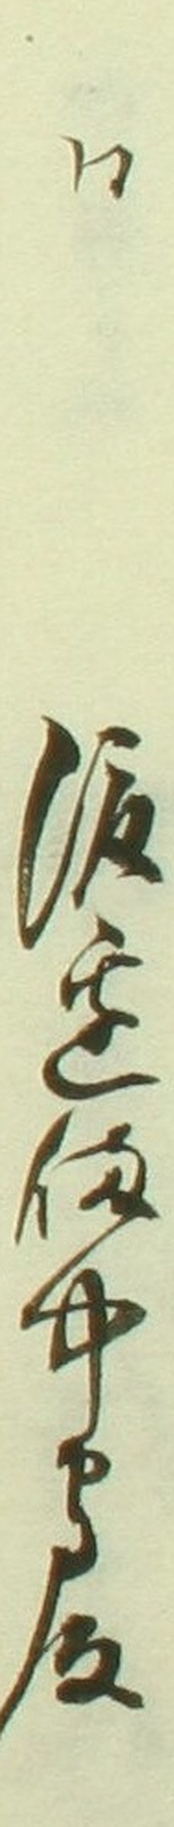同渡辺備中守殿
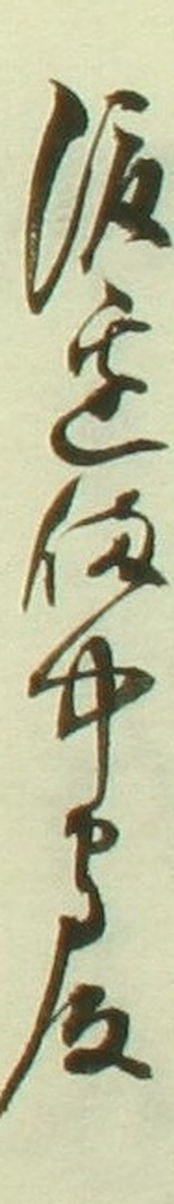同渡辺備中守殿
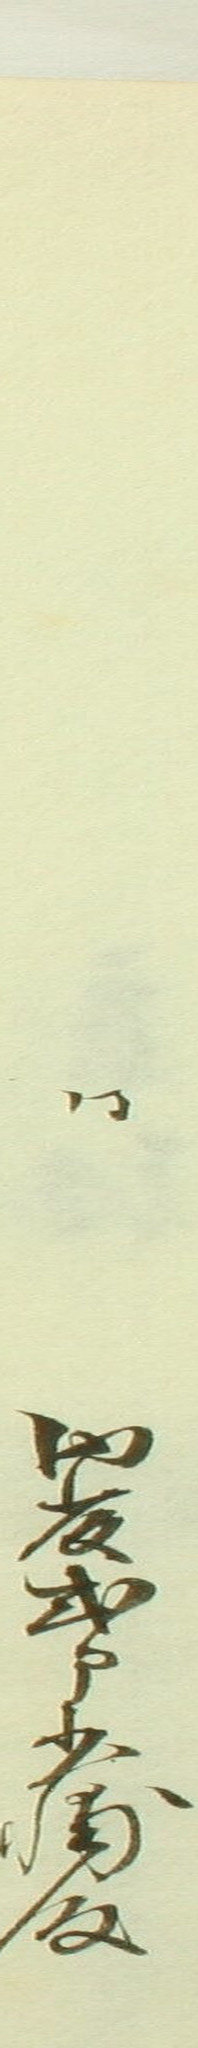同内藤式部少輔殿
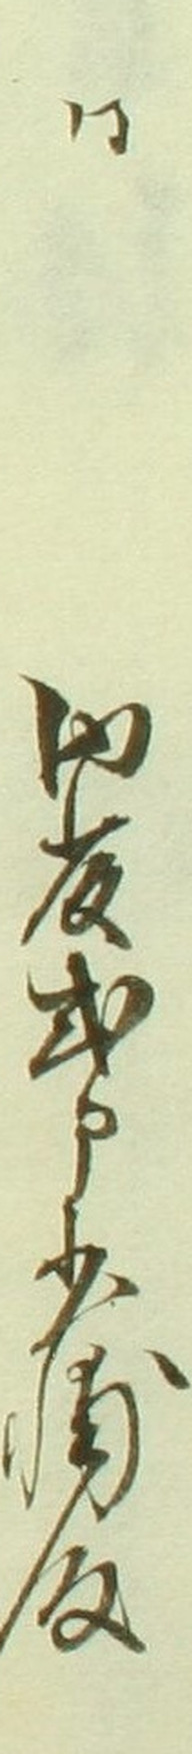同内藤式部少輔殿
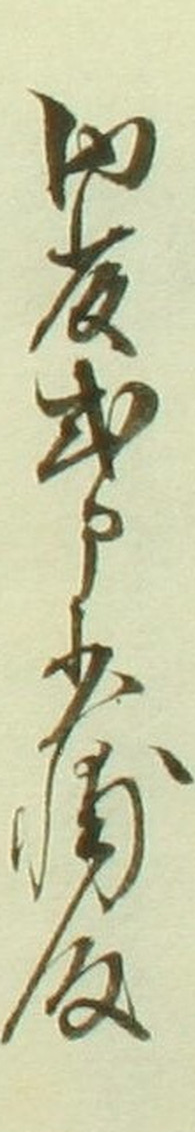同内藤式部少輔殿
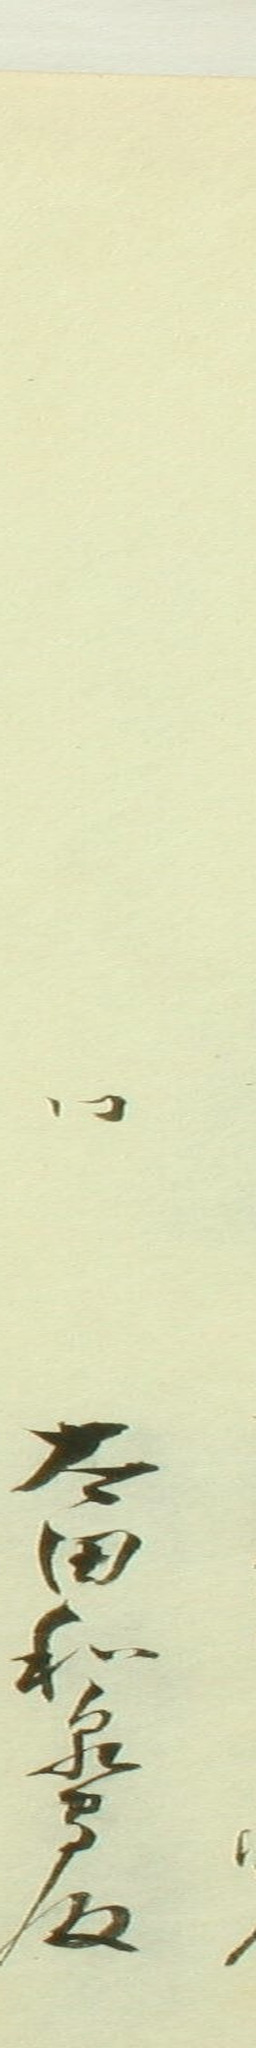同太田和泉守殿
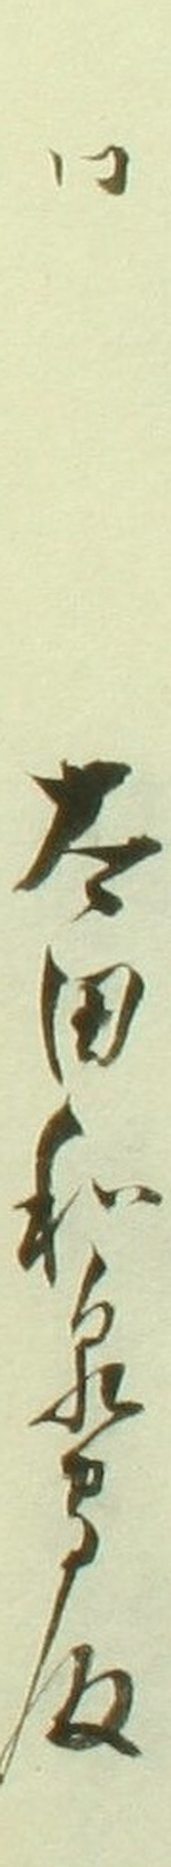同太田和泉守殿
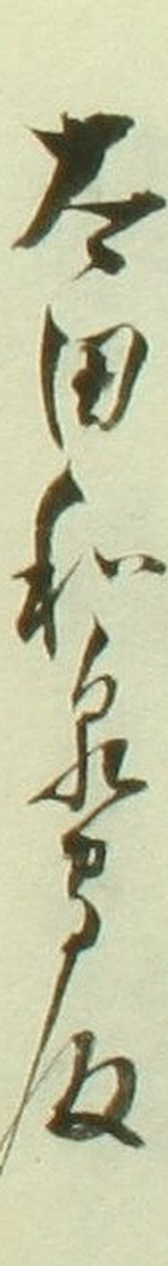同太田和泉守殿
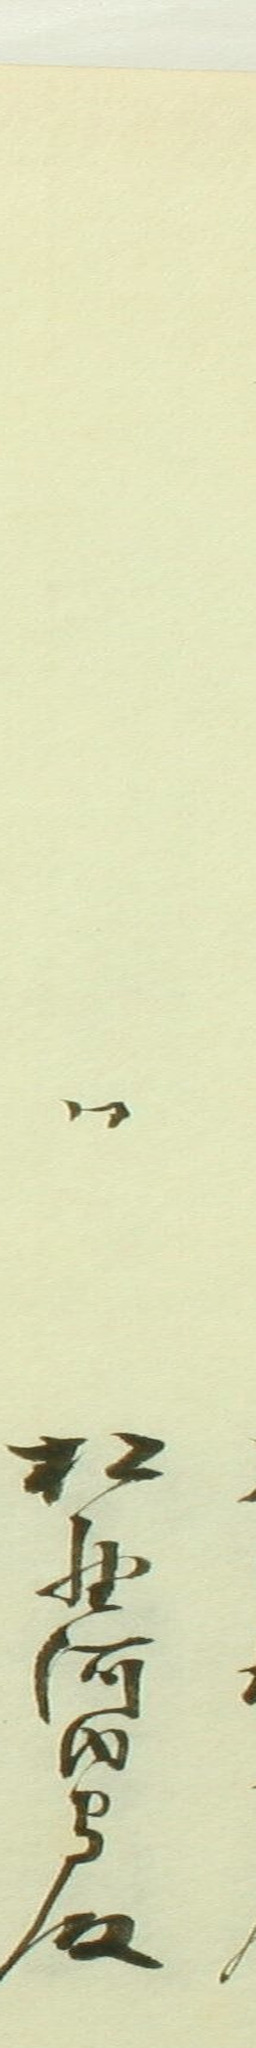同松野河内守殿
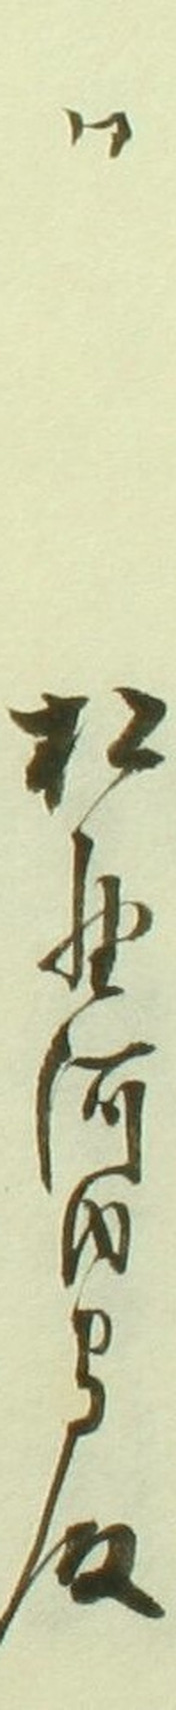同松野河内守殿
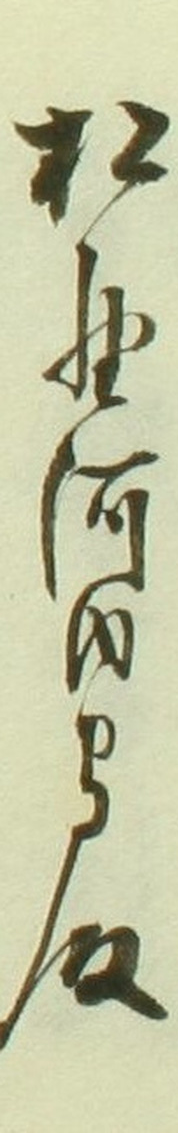同松野河内守殿
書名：異国船漂着記
